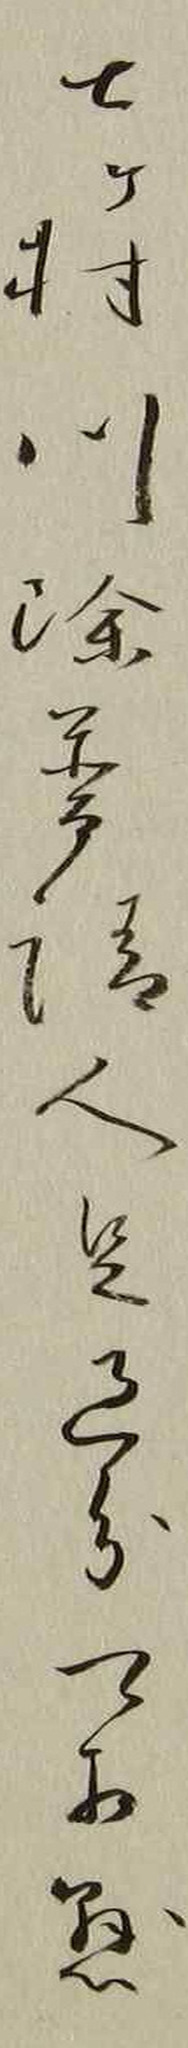七ヶ村川除普請人足過分可相懸
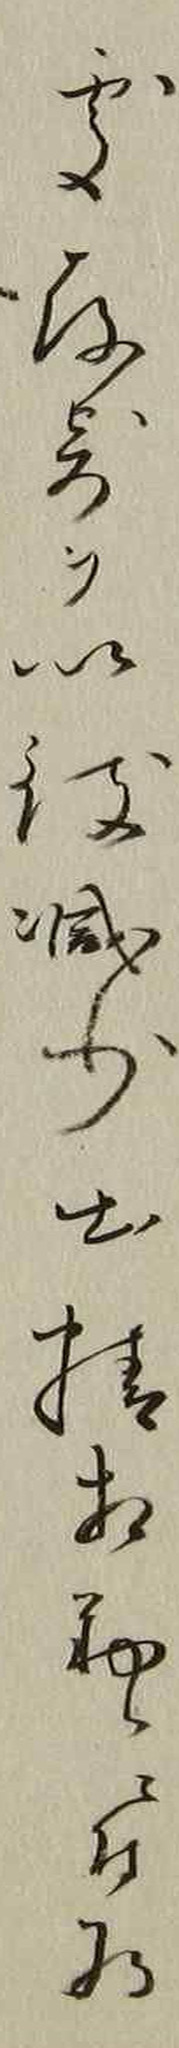処存寄ヲ以致減少出精相勤候ニ付為
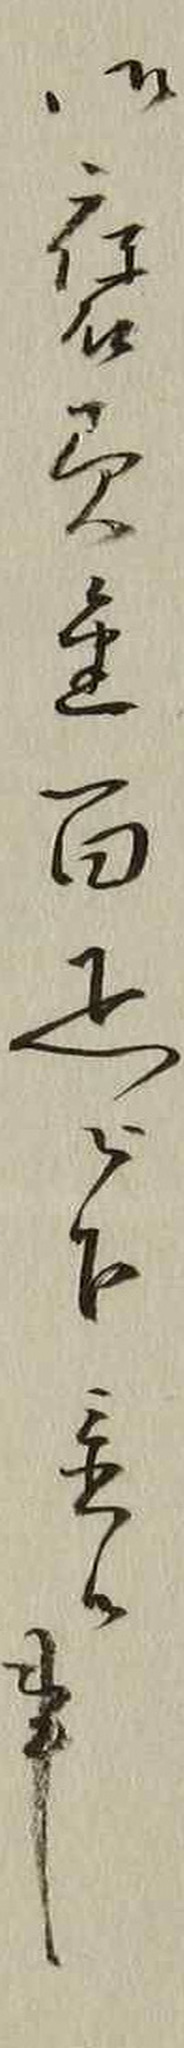御褒美金百疋被下置候事
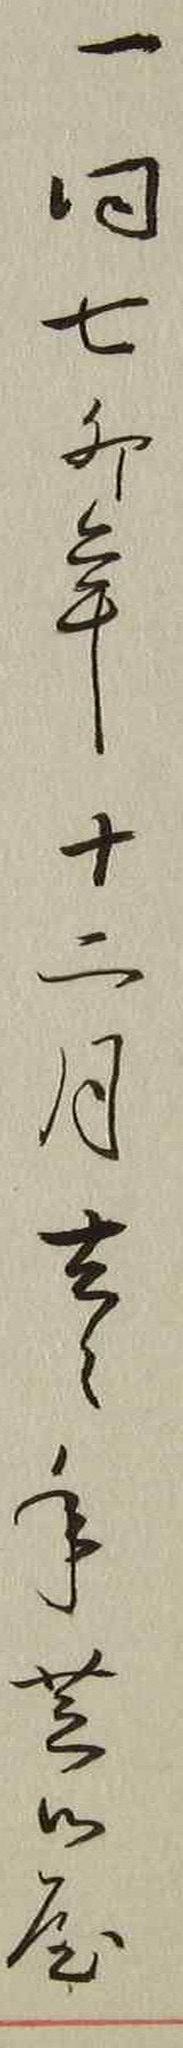一同七卯年十二月去々年芝御屋
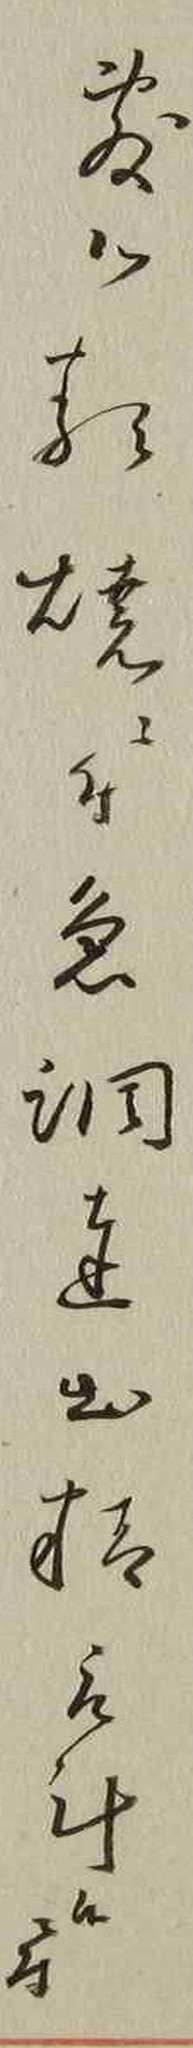敷御類焼ニ付急調達出精取計候ニ付
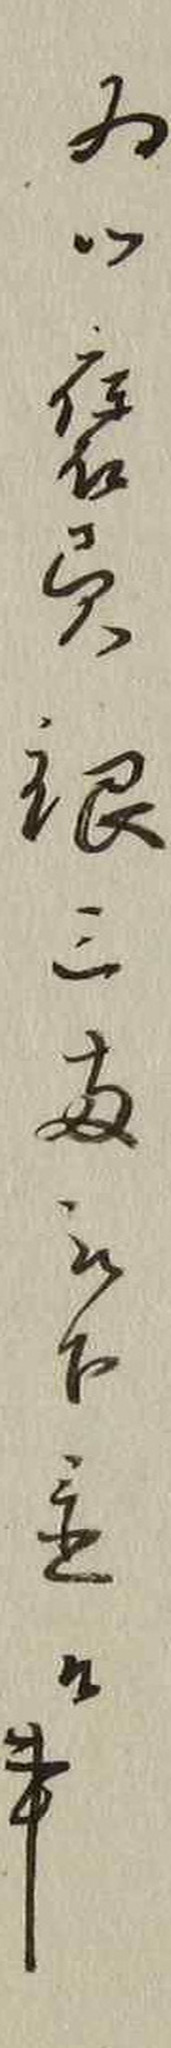為御褒美銀三両被下置候事
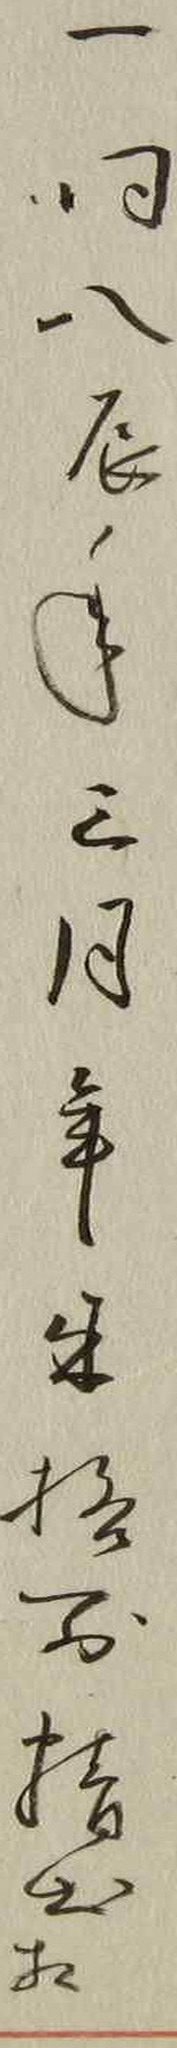一同八辰年三月年来格別精出相
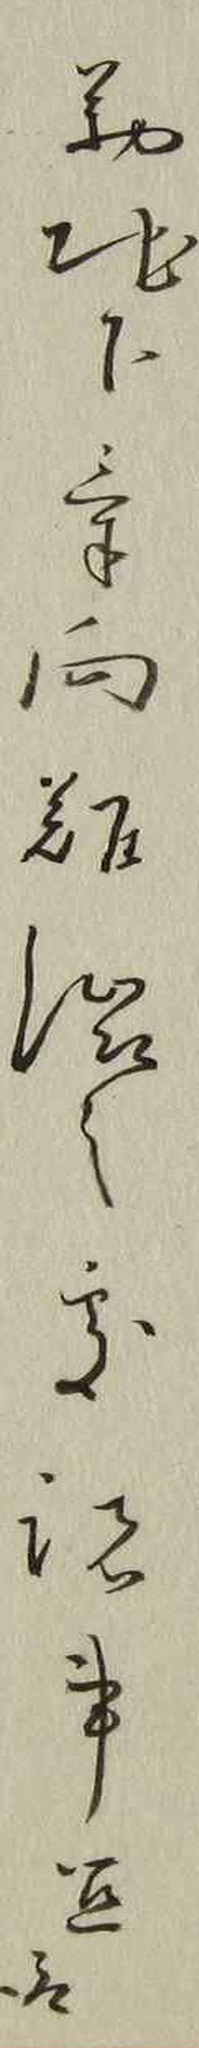勤地下気向難渋之処諸事宜取
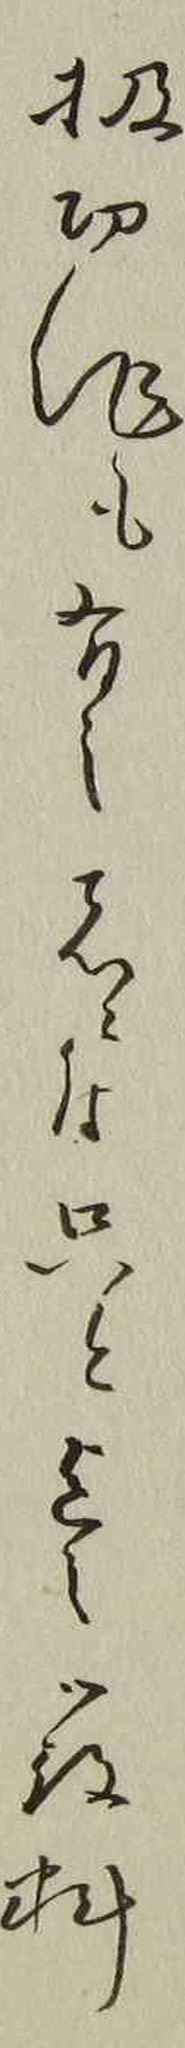扱功作も有之者ニ付只今迄之御役料
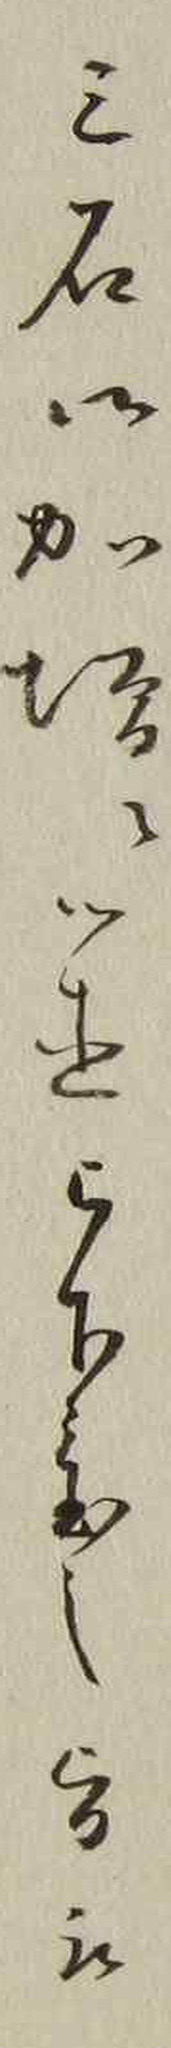三石御加増ニ御直被下置之旨被
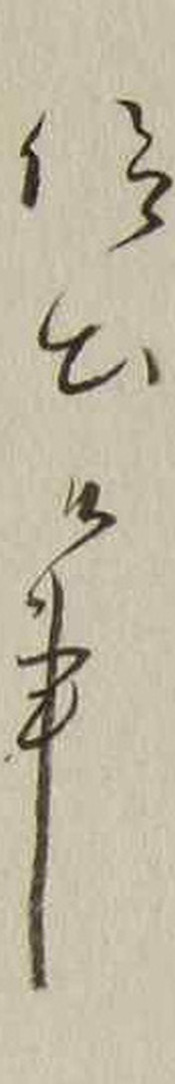仰出候事
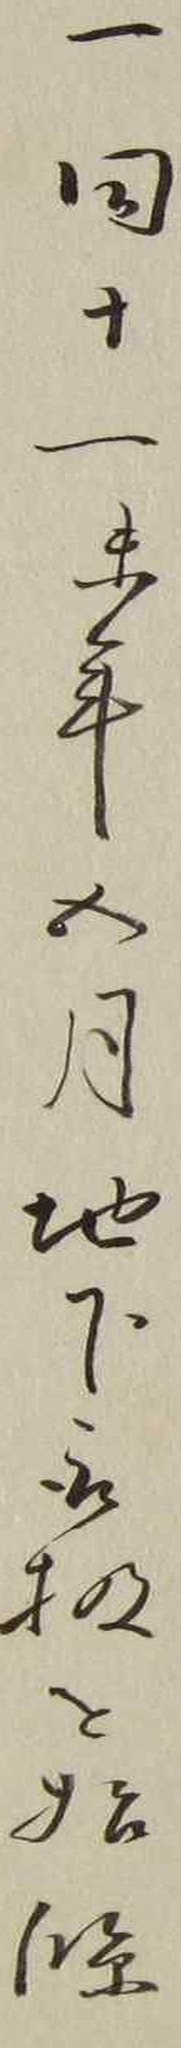一同十一未年五月地下取扱を始臨時
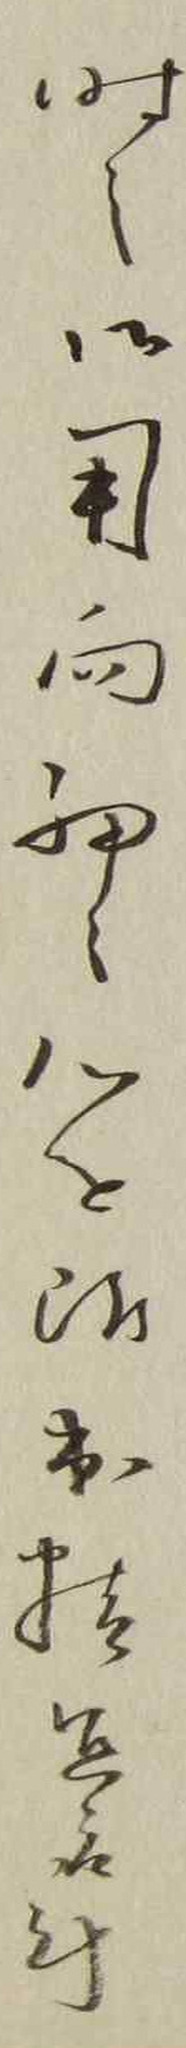之御用向細々心を附出精宜取計

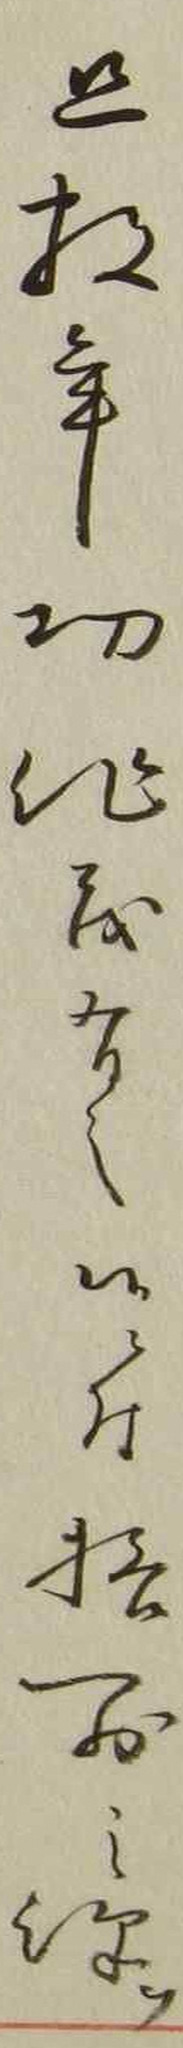且数年功作も有之候ニ付格別之訳ケ
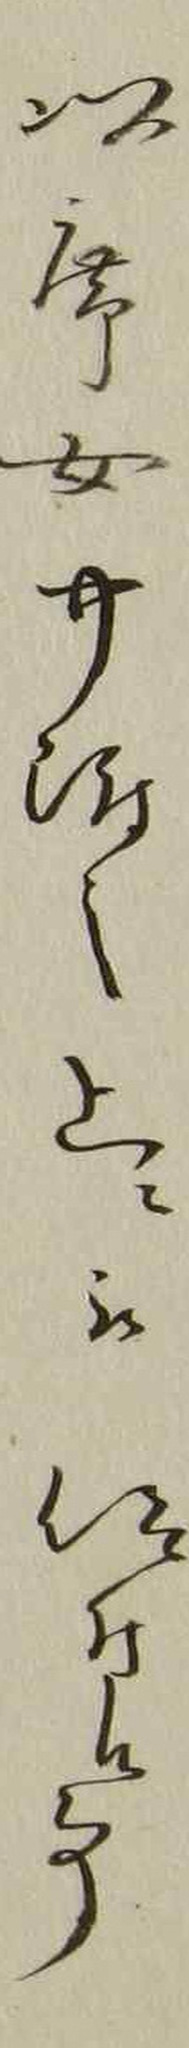以席女中附之上ニ被仰付候事
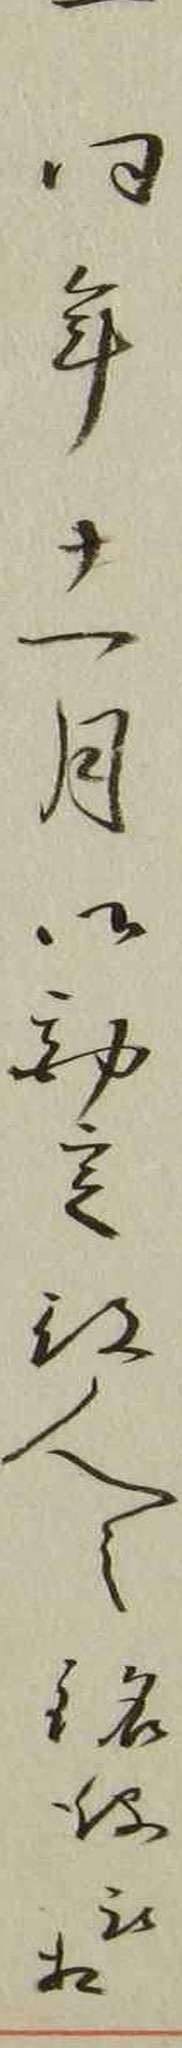一同年十一月御勘定役人之銘儀被相
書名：諸士系譜　巻之8　い之部8
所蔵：会津若松市立会津図書館
